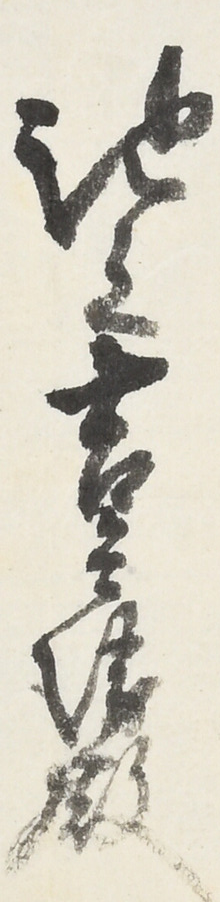池上吉兵衛殿
